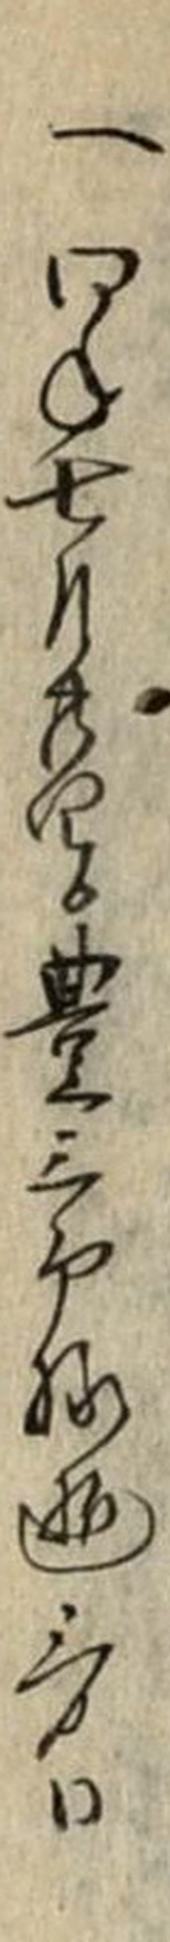一同年七月廿四日豊三郎様逝三日同
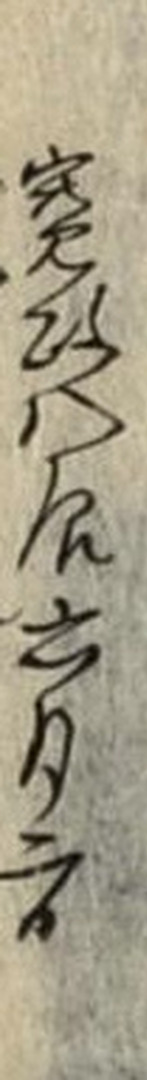寛政八辰六月二日
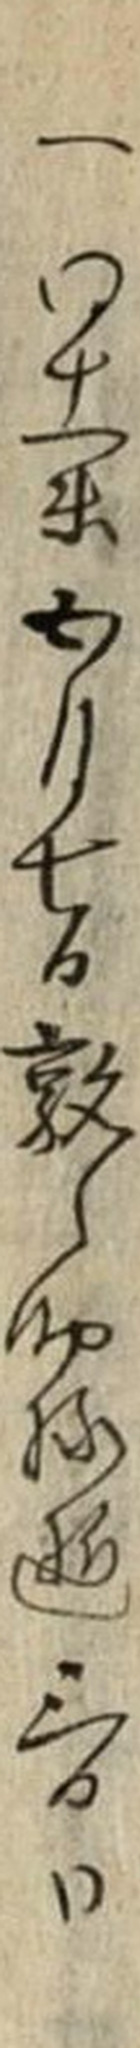一同十一未五月七日敦之助様逝三日同
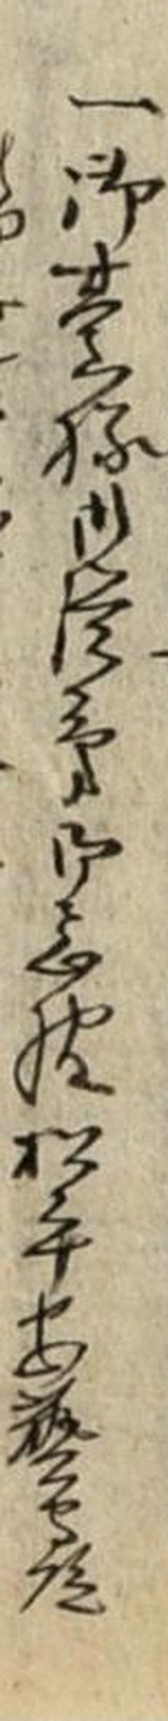一御台様御従弟御忌服松平安芸守殿
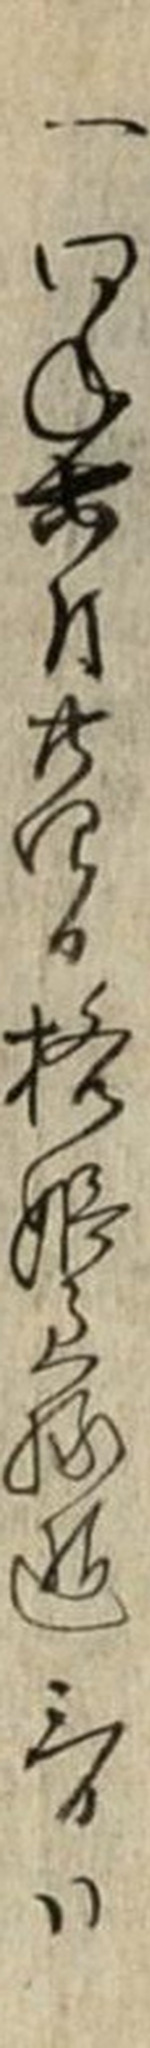一同年六月廿四日格姫君様逝三日同
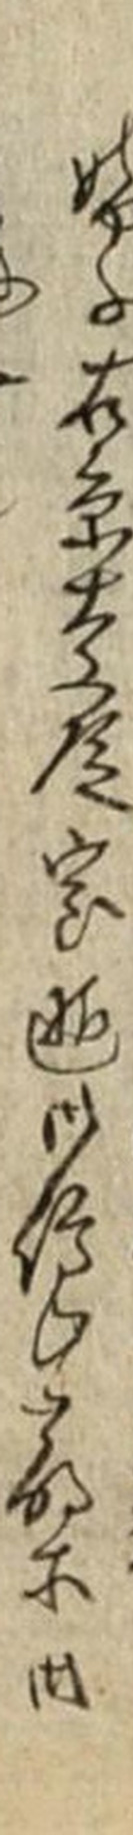嫡子右京大夫殿室逝御停止御触等御
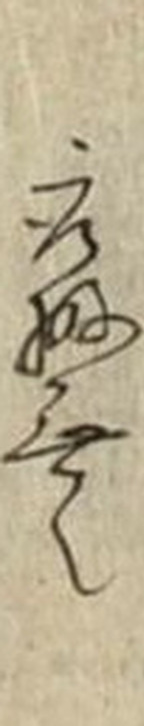取扱無之
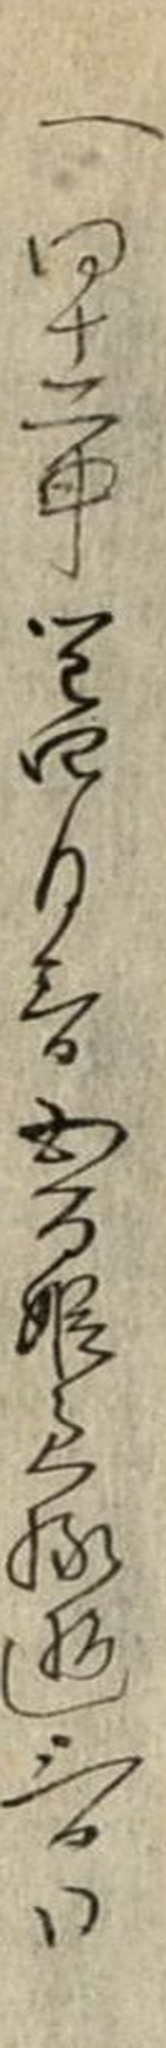一同十二申閏四月三日五百姫君様逝三日同
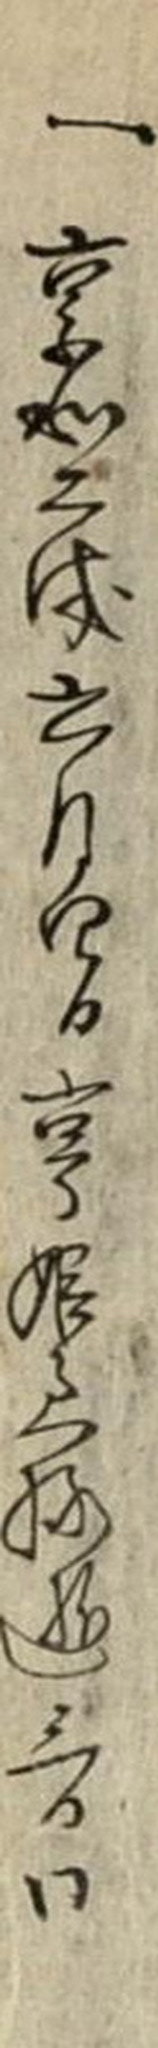一享和二戌六月四日亨姫君様逝三日同
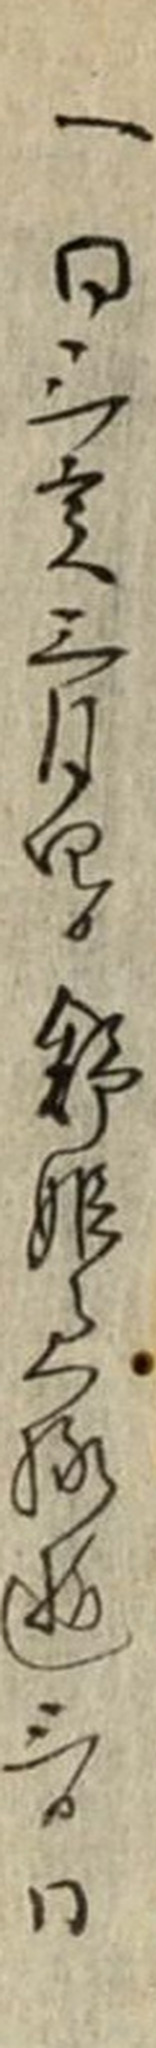一同三亥三月四日舒姫君様逝三日同
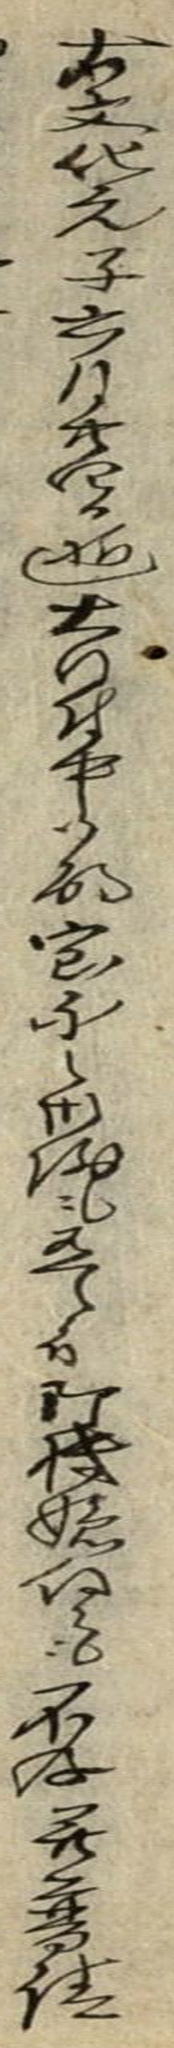右文化元子六月廿四日逝大目付中御触宝永之御例も有之に付御機嫌伺にも不及并普請
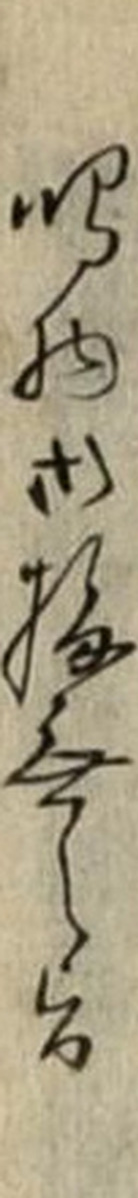鳴物御構無之旨
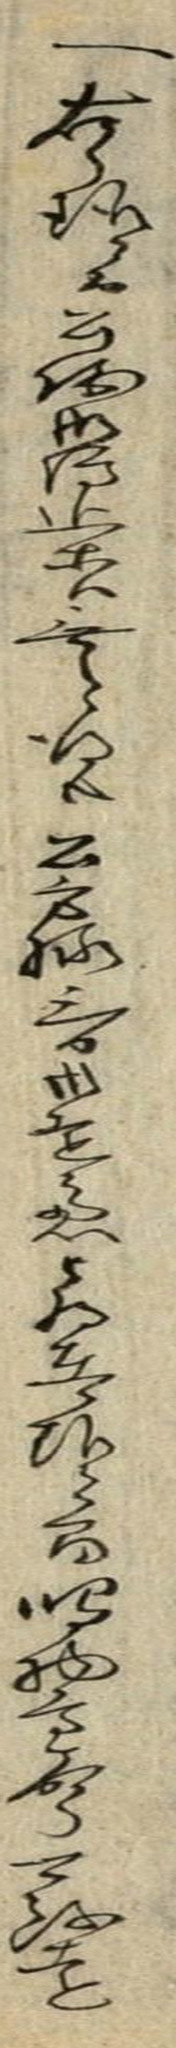一右之趣にて公儀御停止等は無之候得共公方様三日御遠慮被為在候趣に候間鳴物高声可致遠
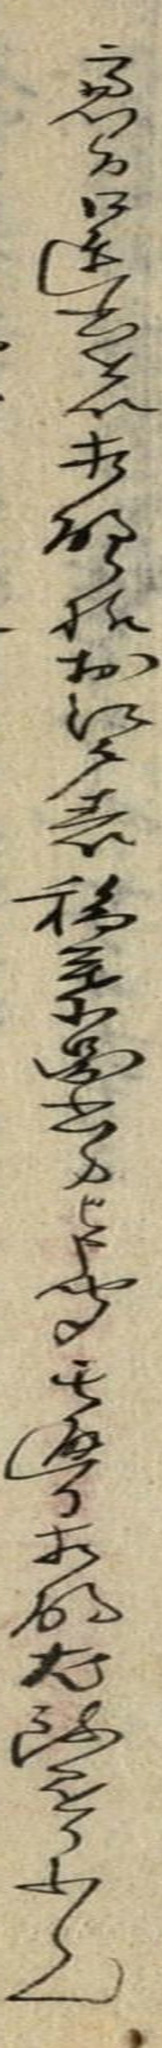慮旨口達書を以相触候様於江戸表稲葉図書方申聞其通り相触尤致懸りふしん
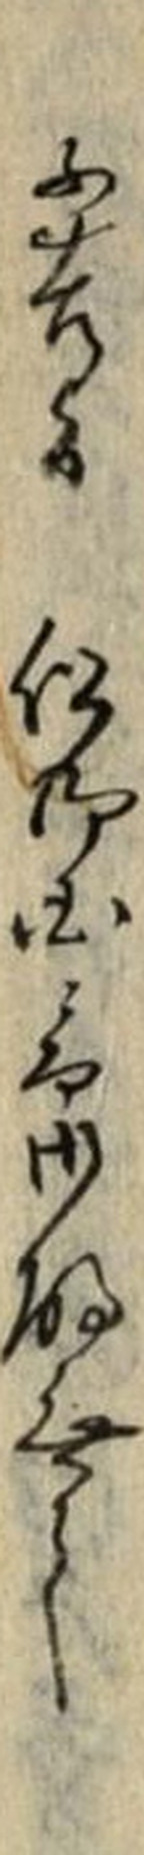不苦旨但御国にて御触無之
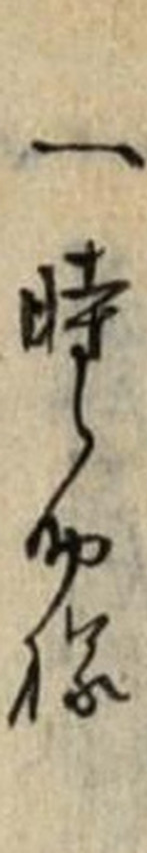一時之助様
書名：御停止異変死失
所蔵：福井県文書館 Fukui Prefectural Archives
